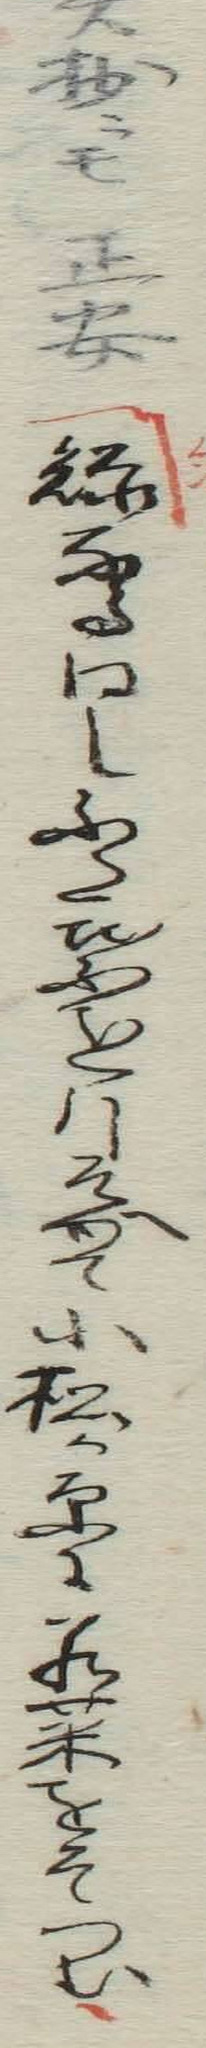補翼抄ニモ正安〽緑なる同しふた葉を引そへて小松か原に若葉をそつむ、
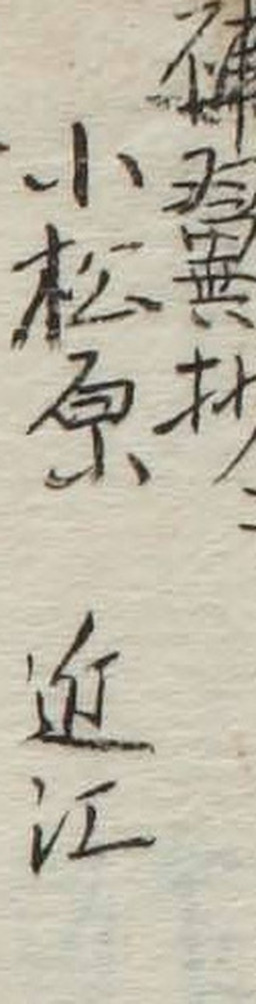小松原近江
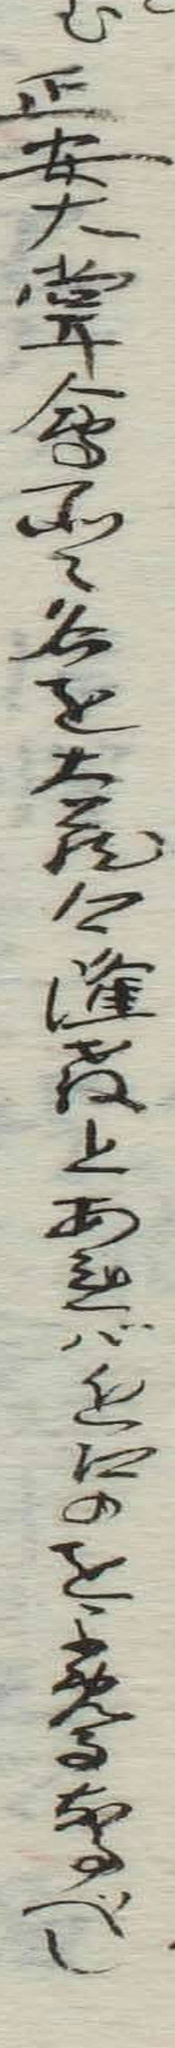正安大嘗所々名を大蔵卿隆教とあれば近江のをよめるなるべし
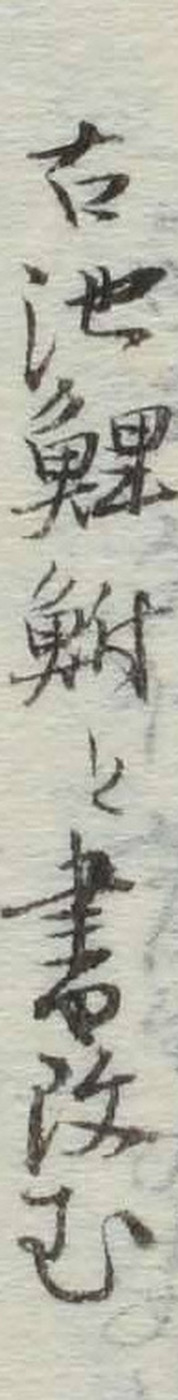古池鯉鮒と書改む
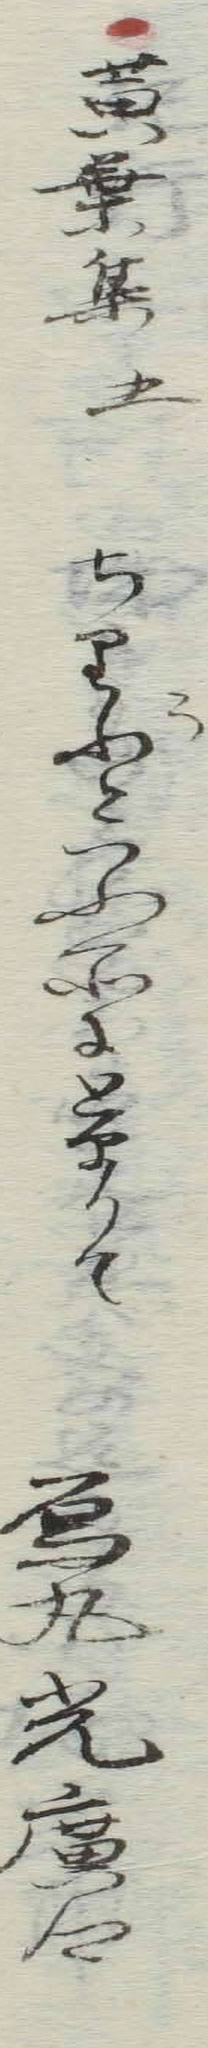●黄葉集五ちりふといふ所にとまりて烏丸光廣卿
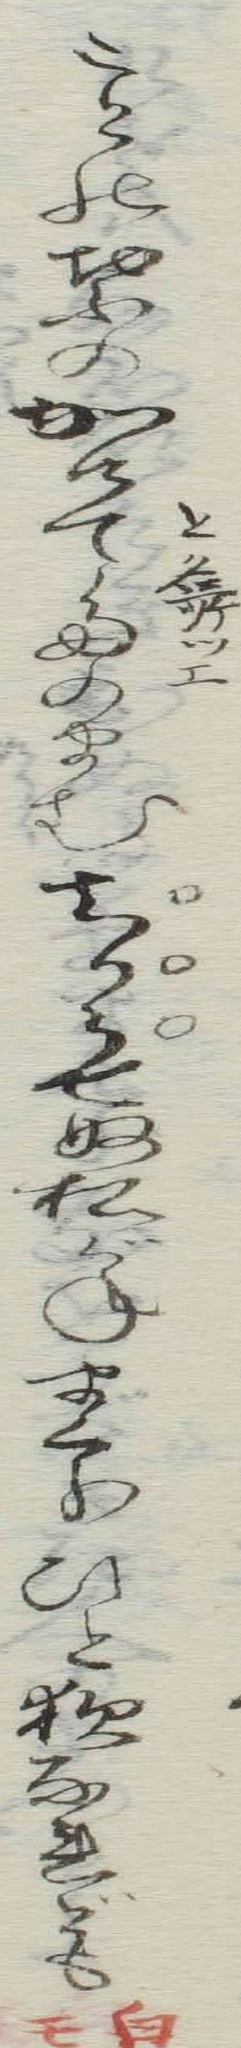ことの葉のかけてたのまむちりうせぬ松がねまくらひと夜なれども白モ
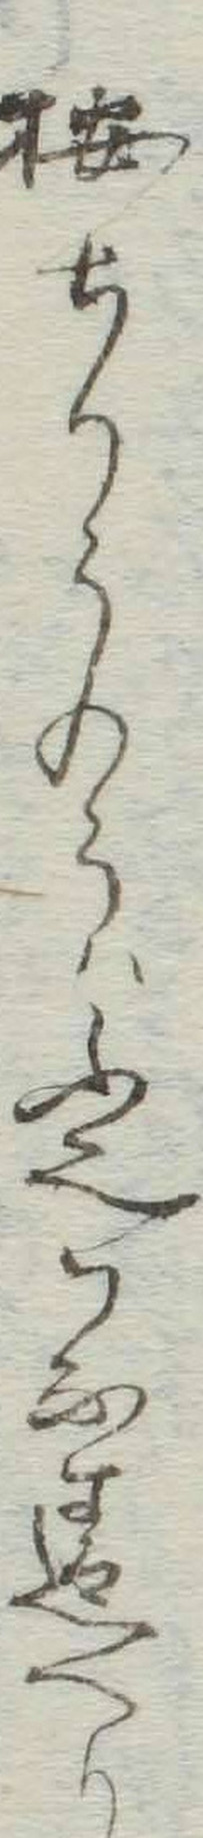按ちりうのうはふ也かな違へり
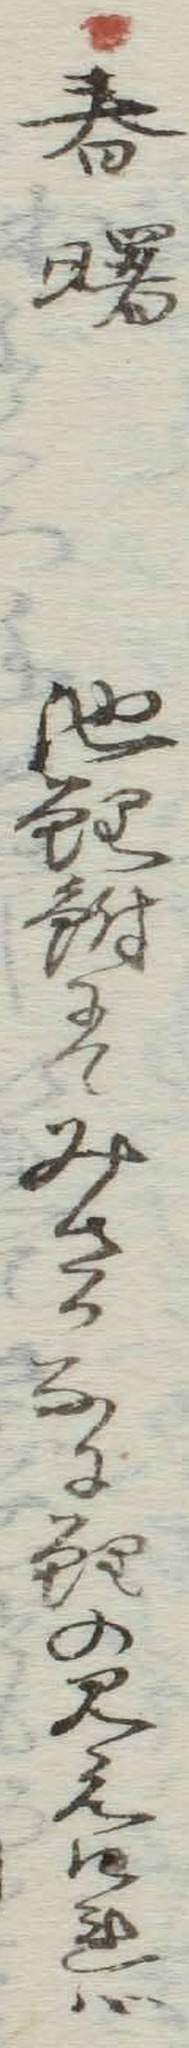●春曙池鯉鮒にてみさかなに鯉の見えければ
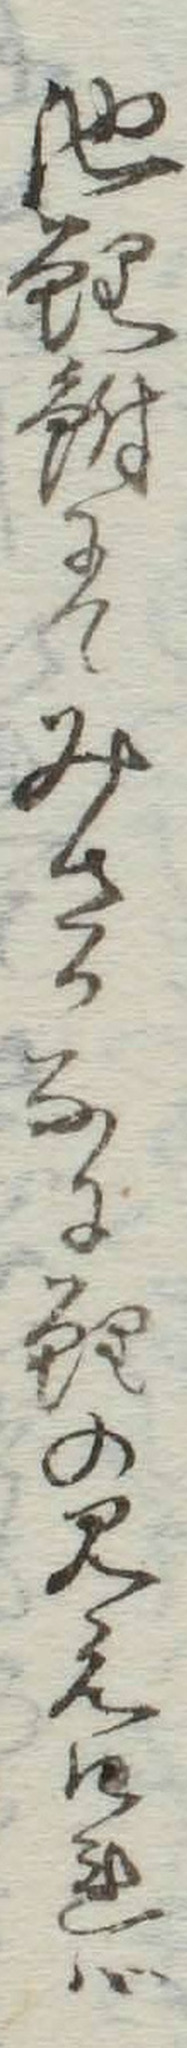●春曙池鯉鮒にてみさかなに鯉の見えければ
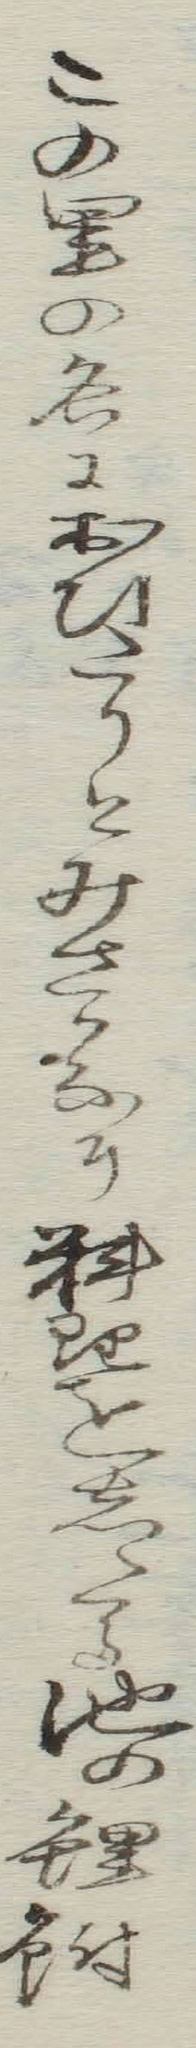この里の名におひたりとみさかなに料理をしたる池の鯉鮒
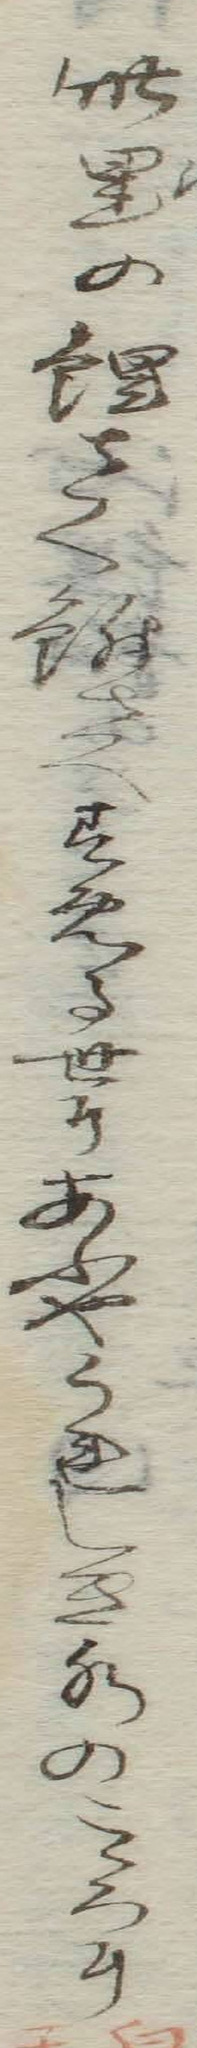此里の鯉さへ鮒さへすめる世にあふやうれしき水のこゝろに白モ
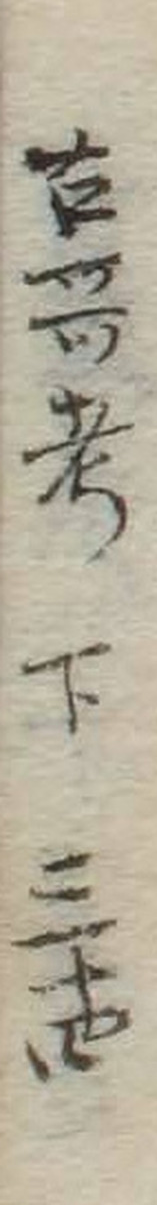古歌考下三十四

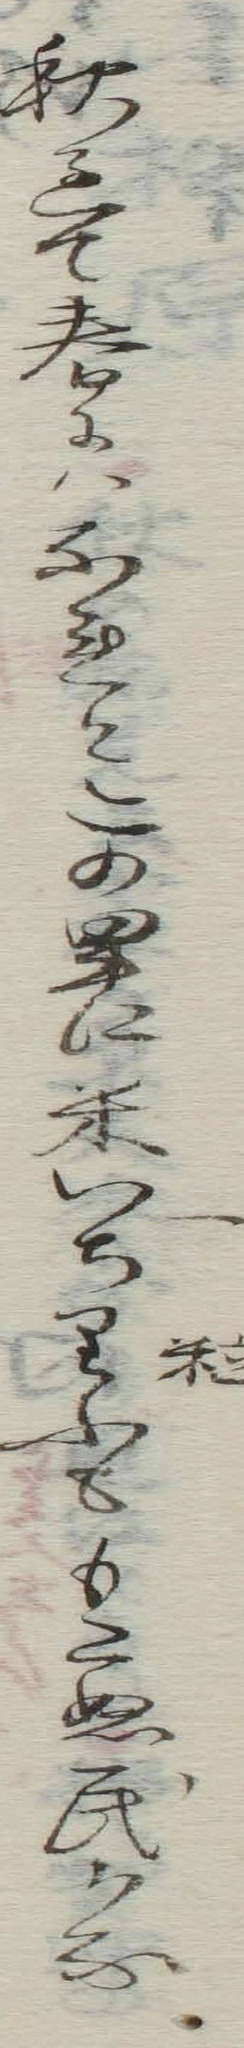秋過て春にはなれとこの里に米いち里ふももたぬ民かな
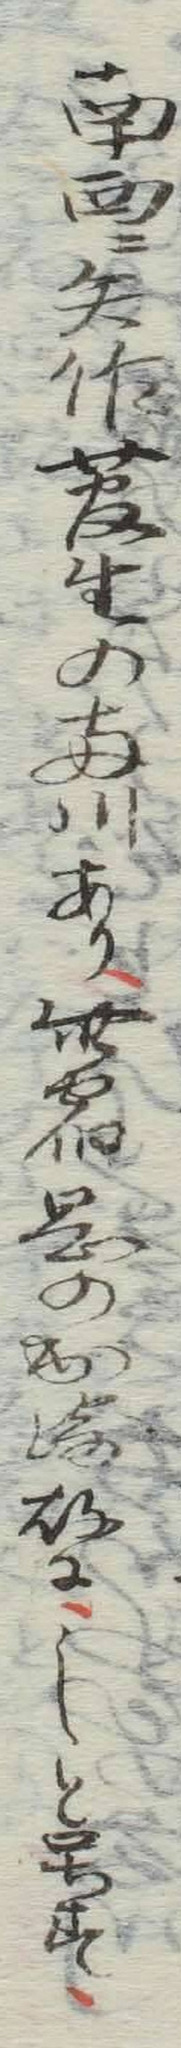南西ニ矢作菅生の両川あり、此宿岡の出崎故に、之と号す、
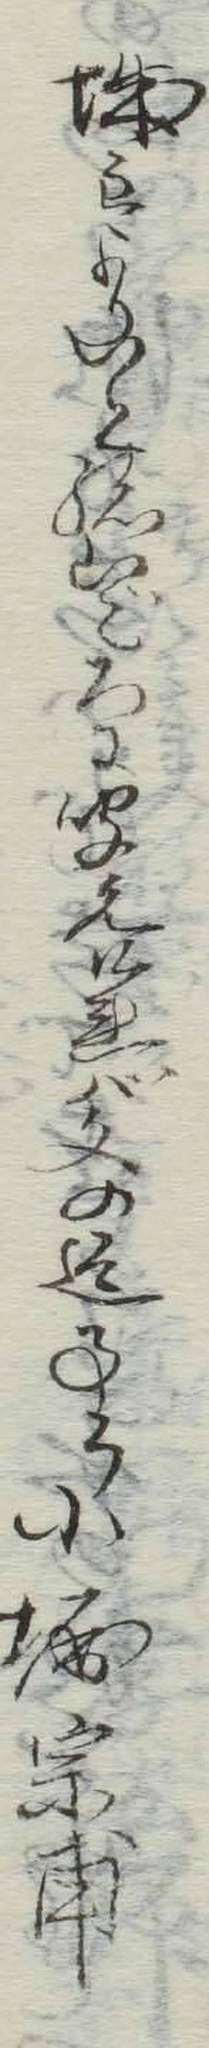○紀行城主よりいとねむごろに聞えければ文の返事に小堀宗甫
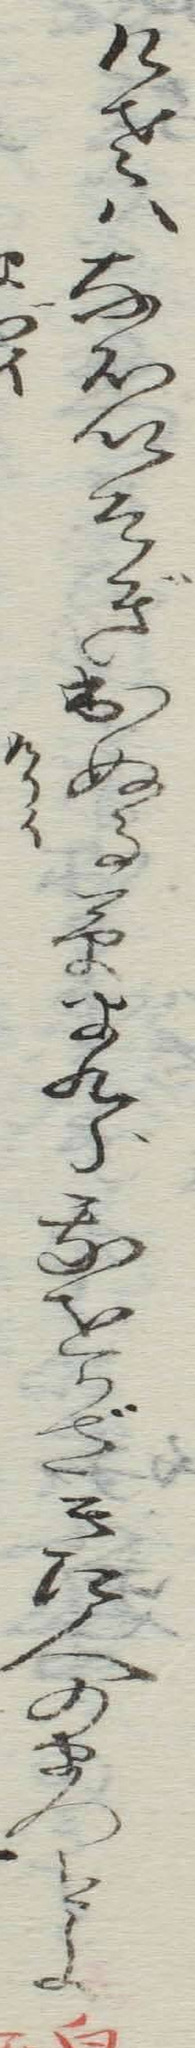けさはなほいそぎ出ぬる草まくら我をかざきに人のまつとよ白モ
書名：三河国古跡考
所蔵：国文学研究資料館
